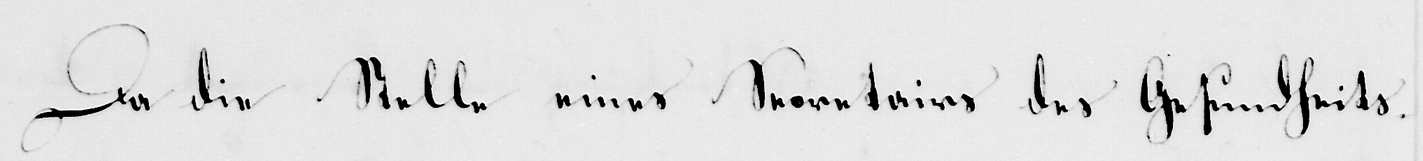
Da die Stelle eines Secretairs des Gesundheits¬
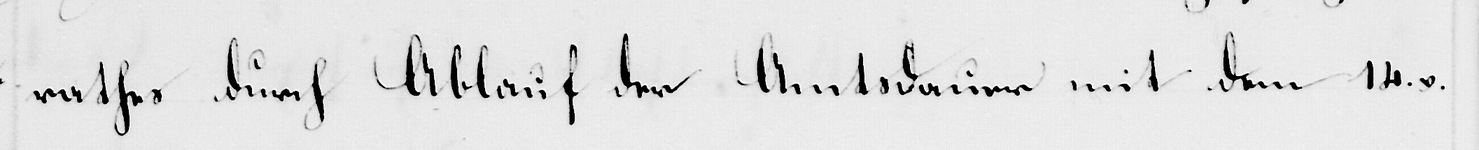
rathes durch Ablauf der Amtsdauer mit dem 14. v.
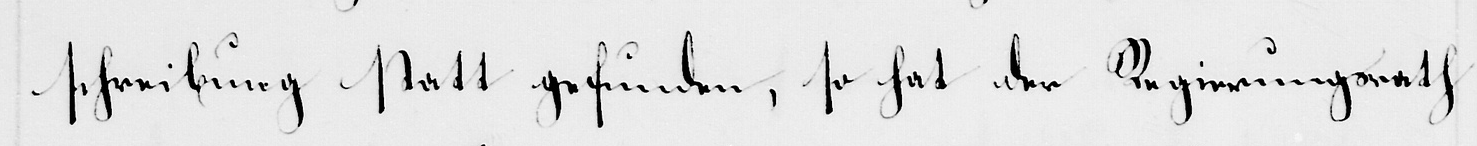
schreibung statt gefunden, so hat der Regierungsrath
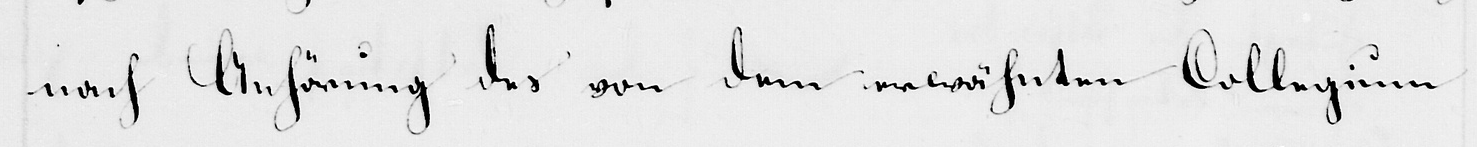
nach Anhörung des von dem erwähnten Collegium
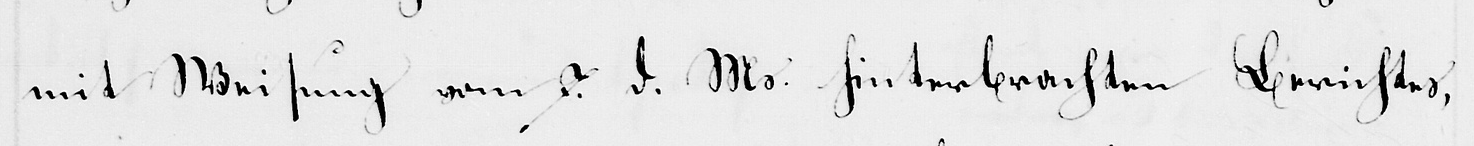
mit Weisung vom 7. d. Ms. hinterbrachten Berichtes,
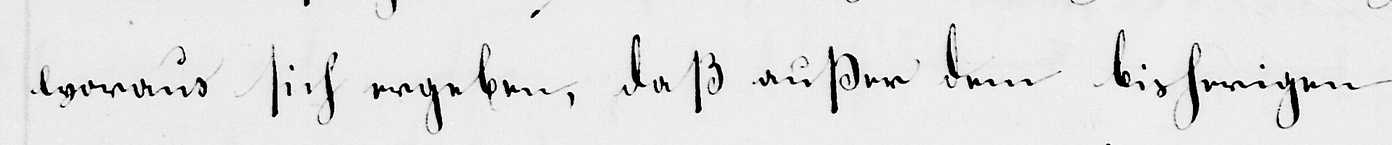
woraus sich ergeben, daß außer dem bisherigen
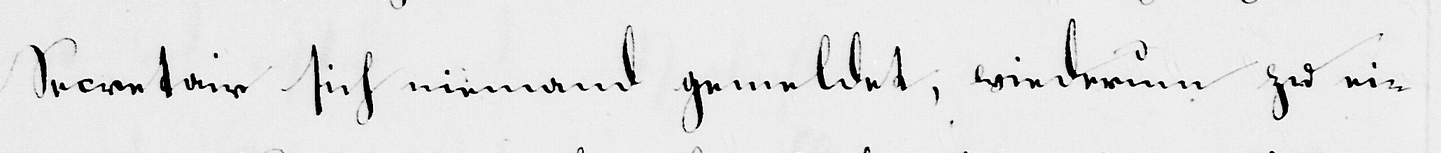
Secretair sich niemand gemeldet, wiederum zu ei¬
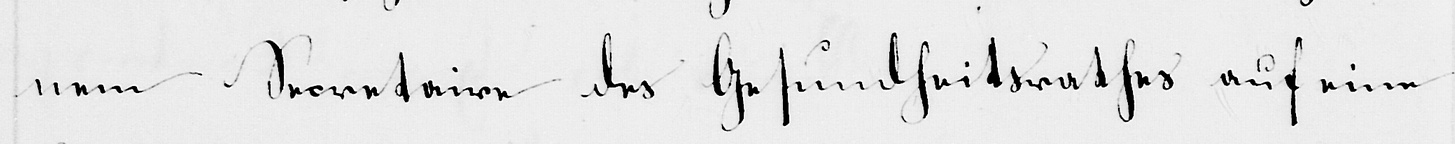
nem Secretaire des Gesundheitsrathes auf eine
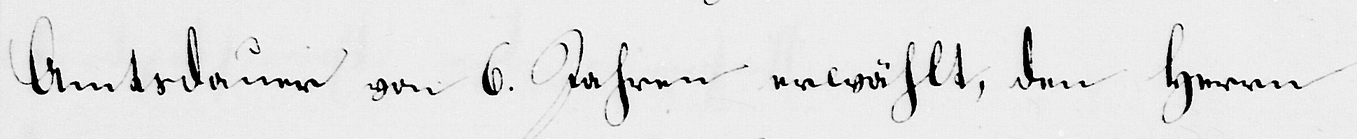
Amtsdauer von 6. Jahren erwählt, den Herrn
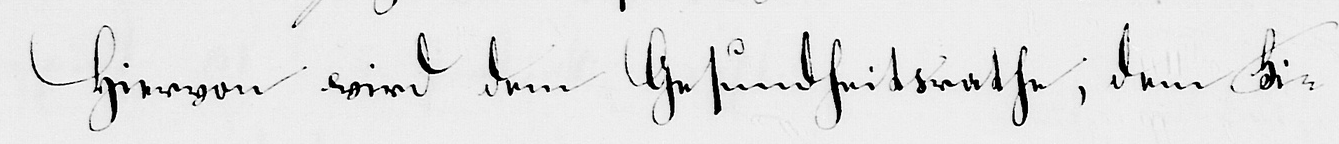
Hiervon wird dem Gesundheitsrathe, dem Fi¬
